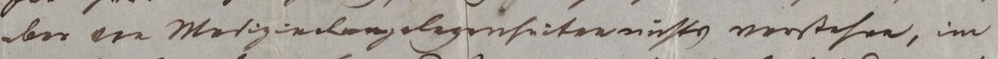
aber von Medizinalangelegenheiten nichts verstehen, im
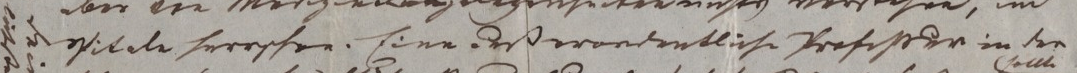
Spitale herrschen. Eine außerordentliche Professur in der
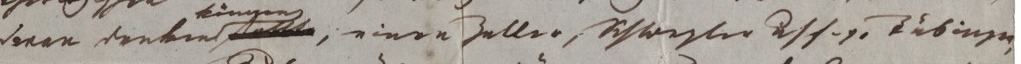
daran denken könnensollte, einen Zeller, Schwegleru. s. f. v. Thübingen,
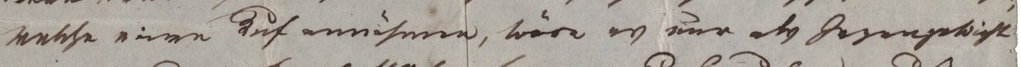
welche einen Ruf annähmen, wäre es nur als Gegengewicht
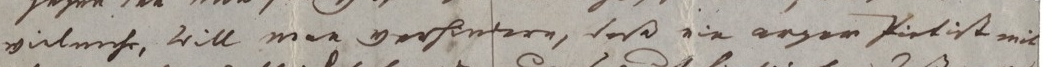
vielmehr, will man verhindern, daß ein arger Pietist mit
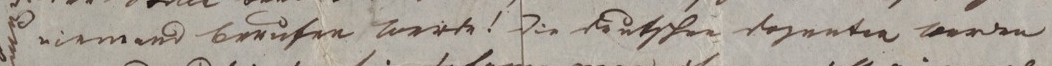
niemand berufen werde! Die deutschen Dozenten werden
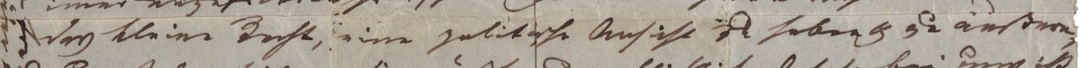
das kleine Recht, eine politische Ansicht zu haben & zu äußern,
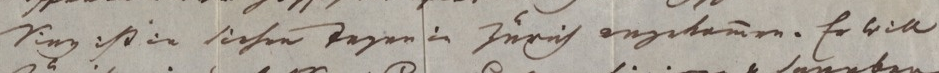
Sinz ist in diesen Tagen in Zürich angekommen. Er will
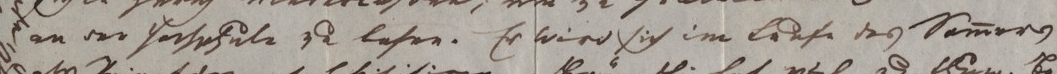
an der Hochschule zu lesen. Er wird sich im Laufe des Sommers
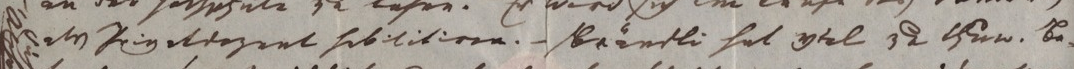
als Privatdozent habilitiren. – Brändli hat viel zu thun. Be-
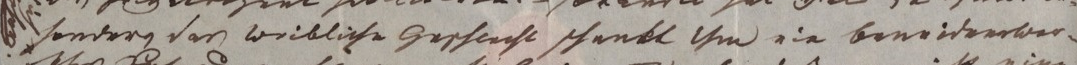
sonders das weibliche Geschlecht schenkt ihm ein beneidenwer-
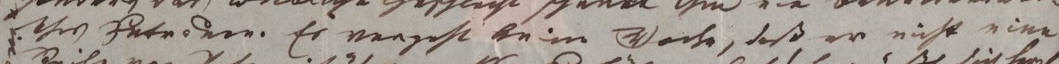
thes Zutrauen. Es vergeht keine Woche, daß er nicht eine
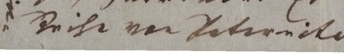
ich neuerdings sagen, wie sehr es Deine
